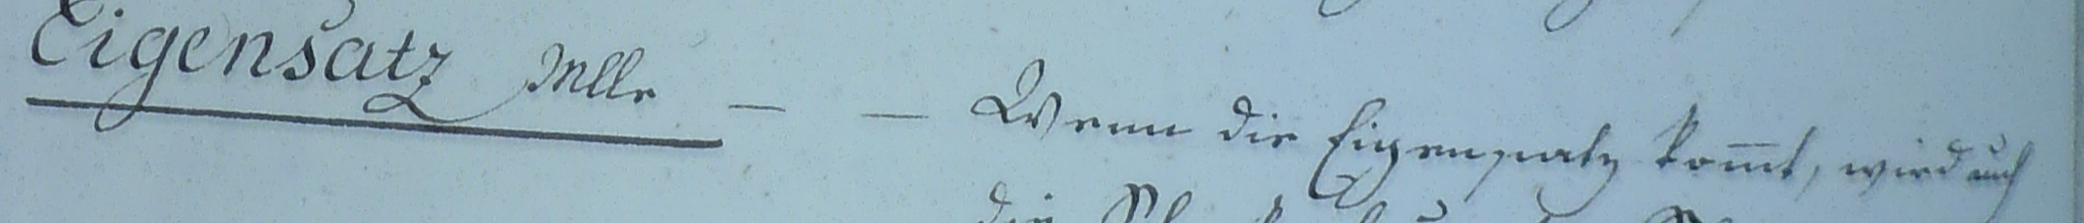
Eigensatz Mlle _ _ Wenn die Eigensatz kom̅t, wird auch
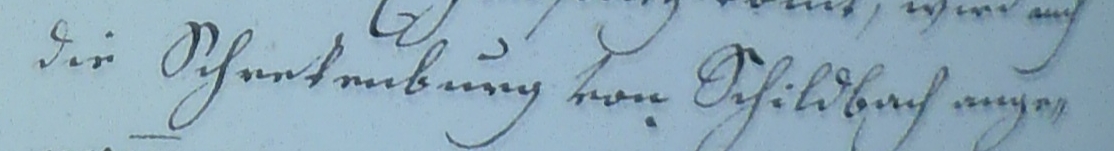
die Schrekenburg von Schildbach ange¬
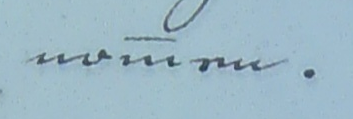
nom̅en.
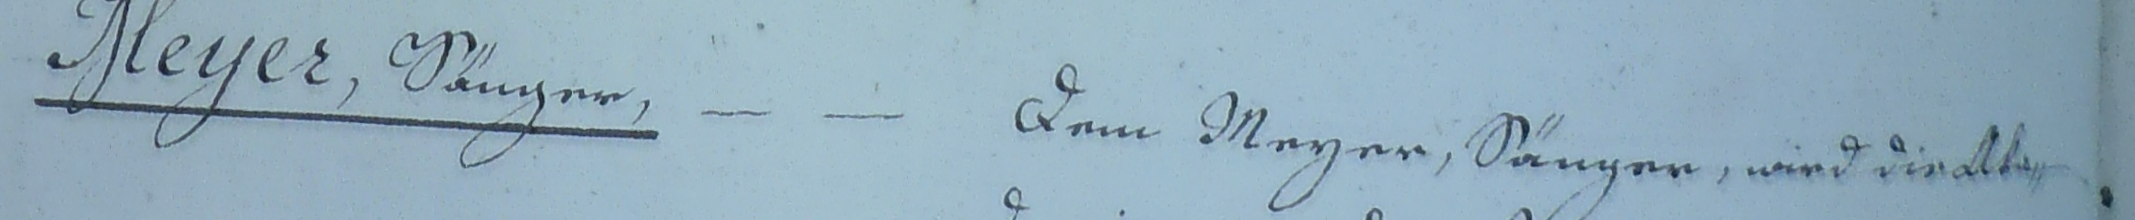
Meyer, Sänger, _ _ Dem Meyer, Sänger, wird die Aka¬
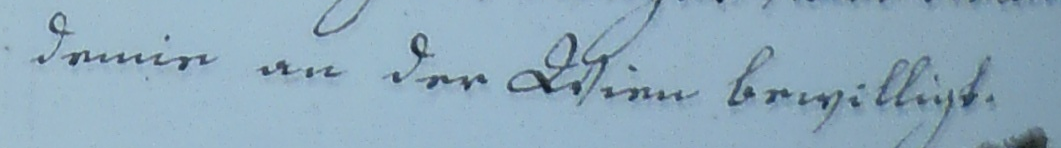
demie an der Wien bewilligt.
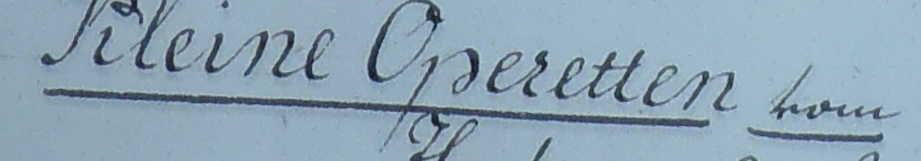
Kleine Operetten vom
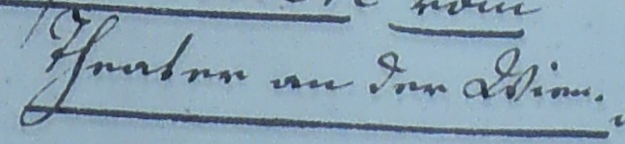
Theater an der Wien.
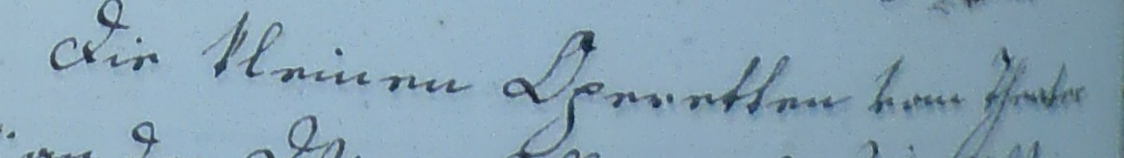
Die kleinen Operetten vom Theater
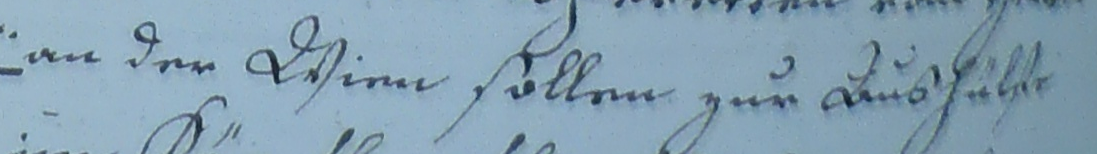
an der Wien sollen zur Aushülfe
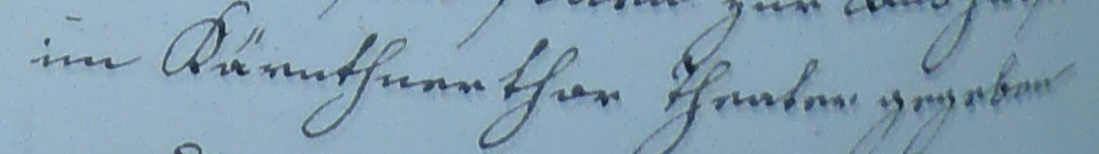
im Kärnthnerthor Theater gegeben
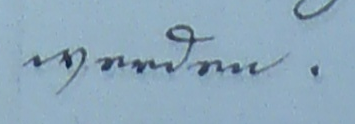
werden.
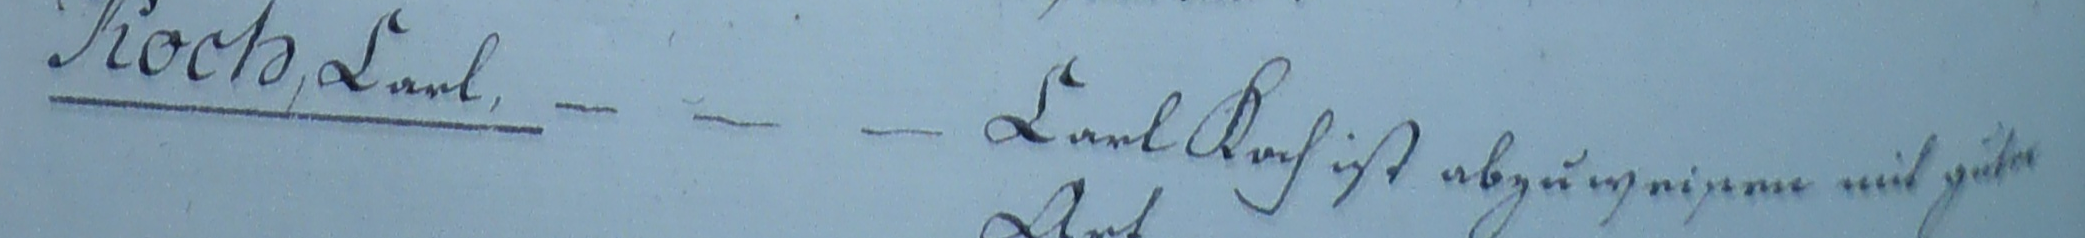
Koch, Carl, _ _ _ Carl Koch ist abzuweisen mit guter
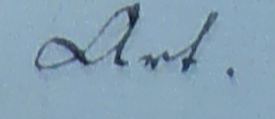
Art.
